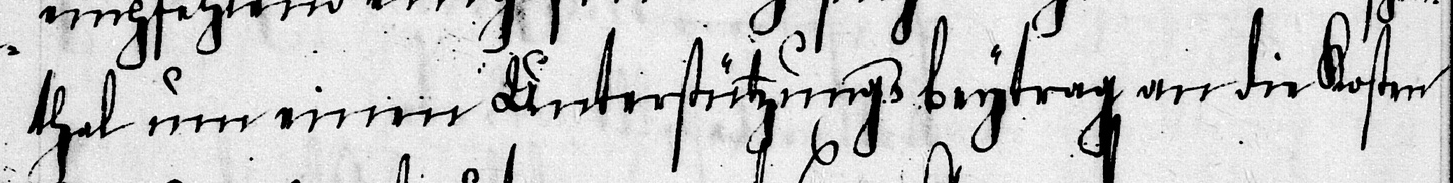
nthal um einen Unterstützungsbeytrag an die Kosten
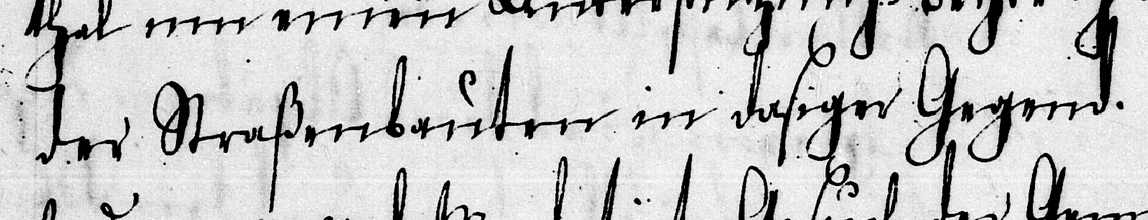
der Straßenbauten in dasiger Gegend.
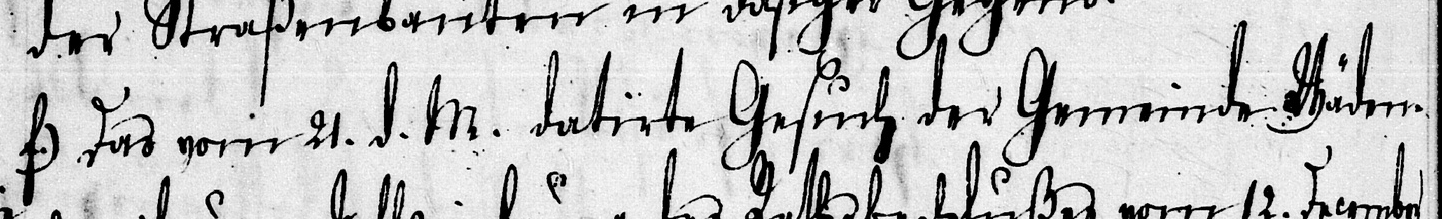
f.) Das vom 21. d. M. datirte Gesuch der Gemeinde Wäden¬
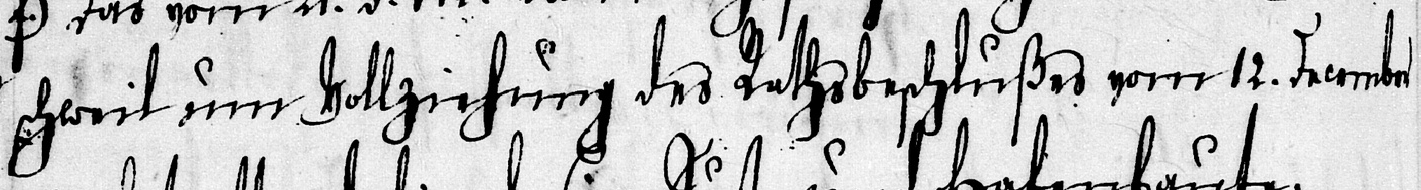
schweil um Vollziehung des Rathsbeschlußes vom 12. Decem¬
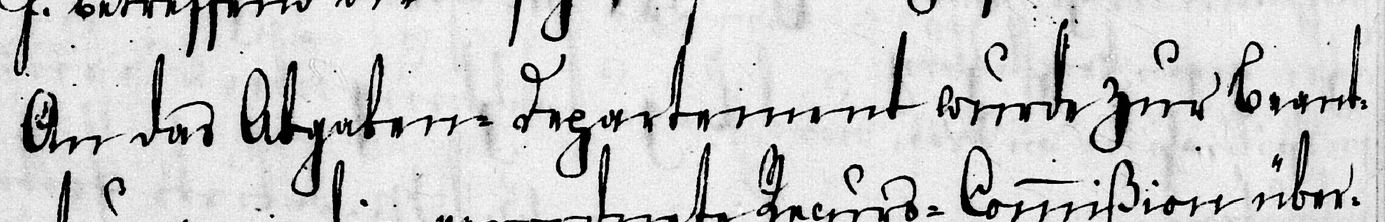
An das Abgaben-Departement wurde zur Beant¬
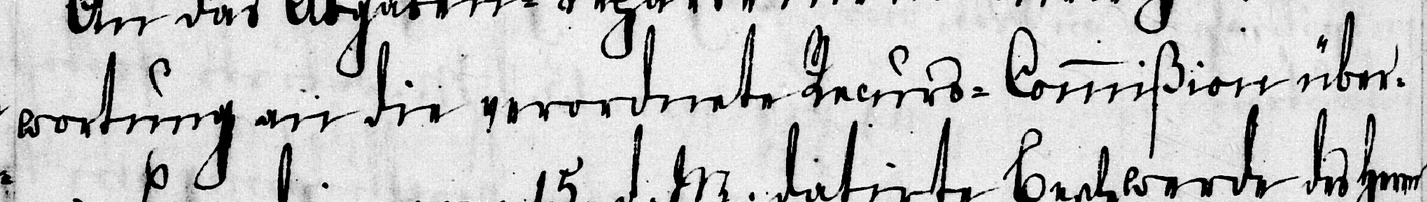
wortung an die verordnete Recurs-Commißion über¬
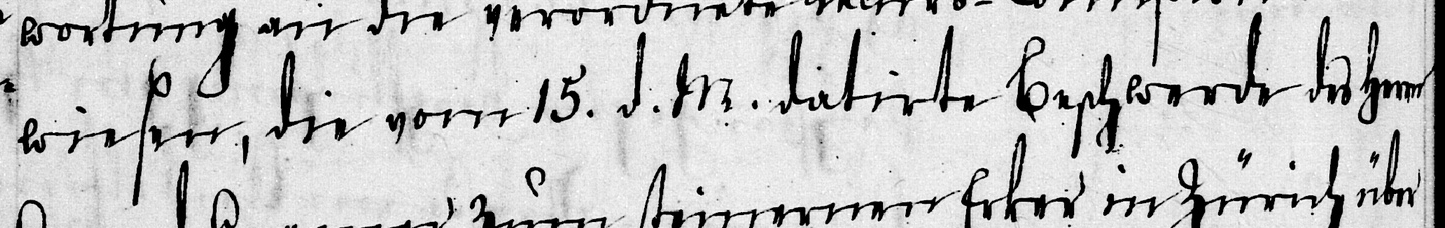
wiesen, die vom 15. d. M. datirte Beschwerde des Her¬
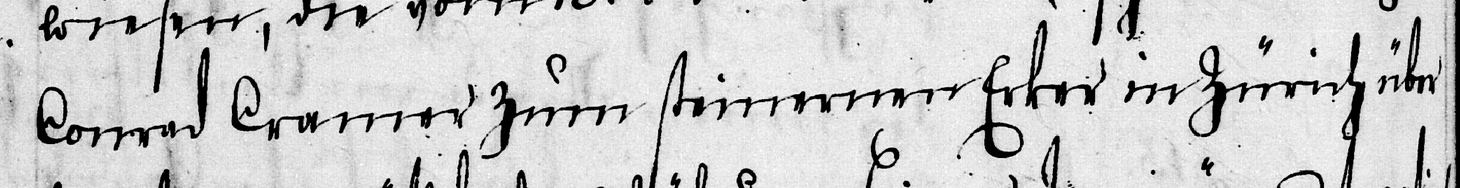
Conrad Cramer zum steinernen Erker in Zürich über
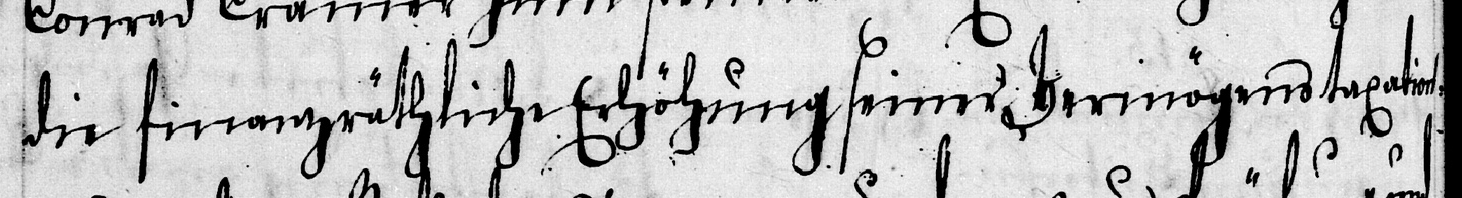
die finanzräthliche Erhöhung seiner Vermögenstaxat¬
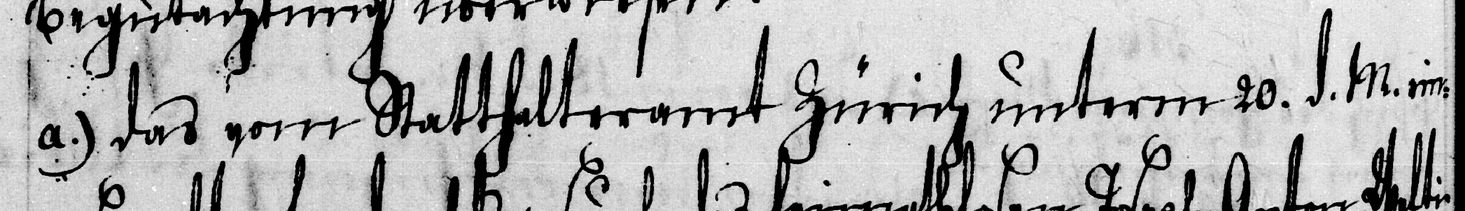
a.) das vom Statthalteramt Zürich unterm 20. d. M. e¬
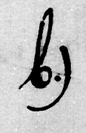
ber
